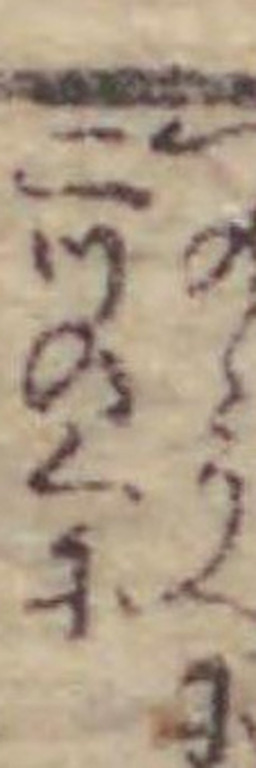二つのくに
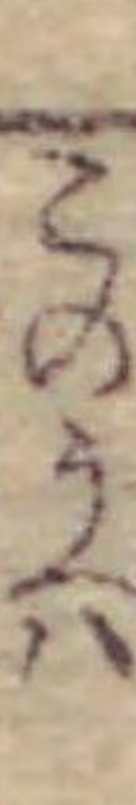このうへは
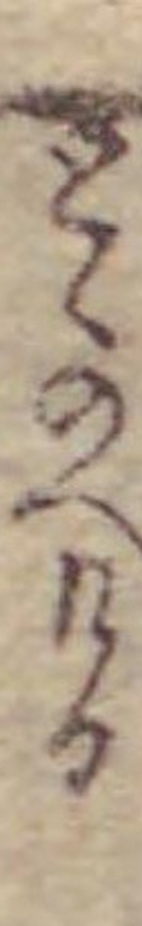とゝのへける
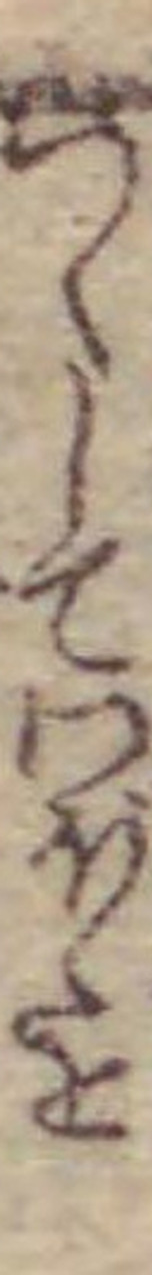つくしてわぼくを

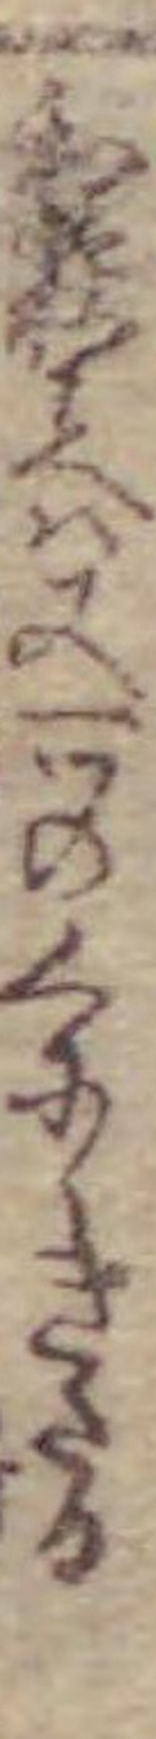和荘兵へは又一つのくにゝきたる
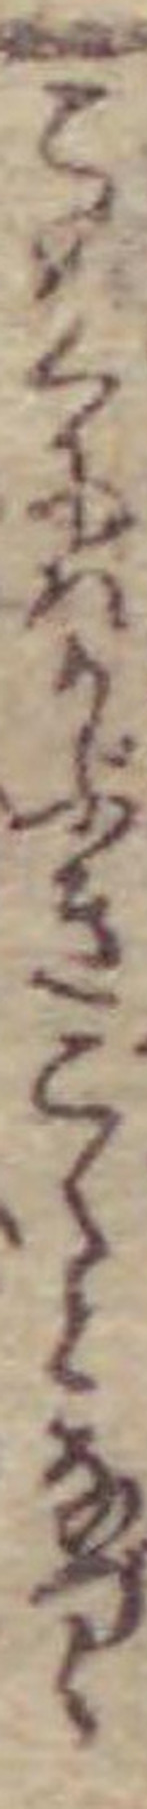こめくにはかぶきこくとなづく
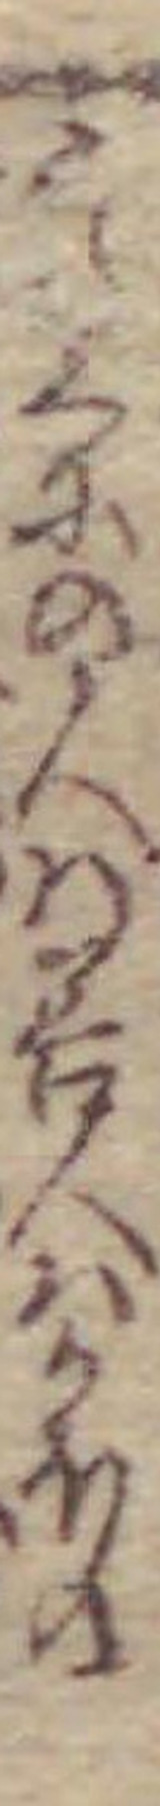このくにの人は善人はかほの
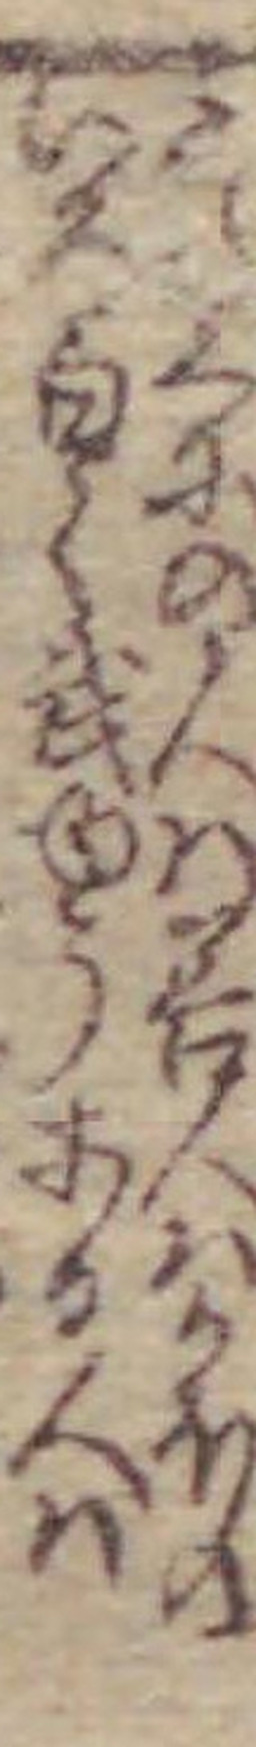いろ白く武ゆうある人は
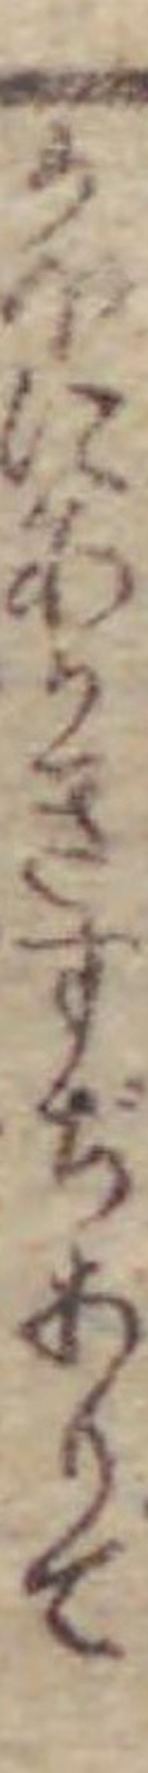かほにあかきすぢありて
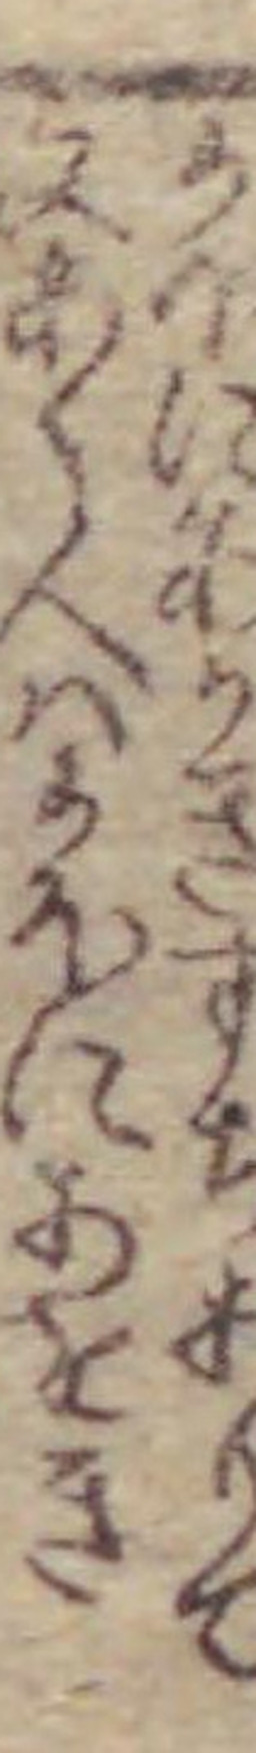又あく人はかほにあをき
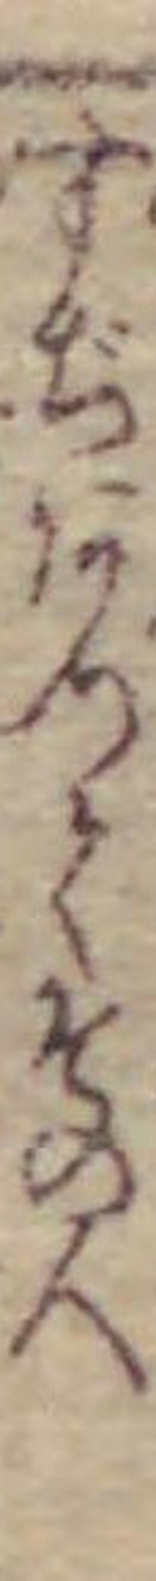すぢあつてその人
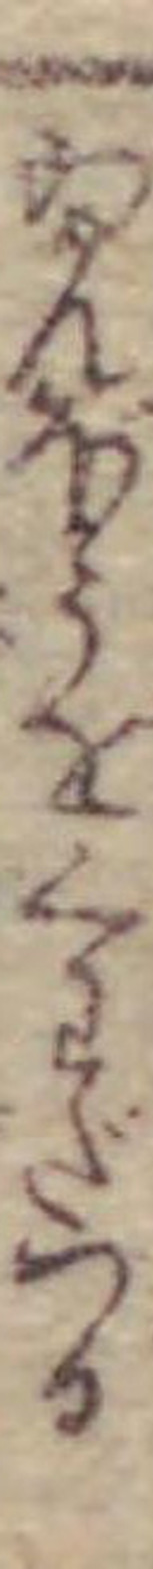ゐんぼうをくわだつる
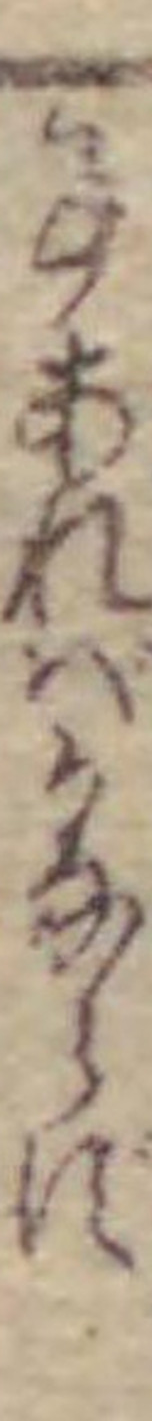事あればかならず
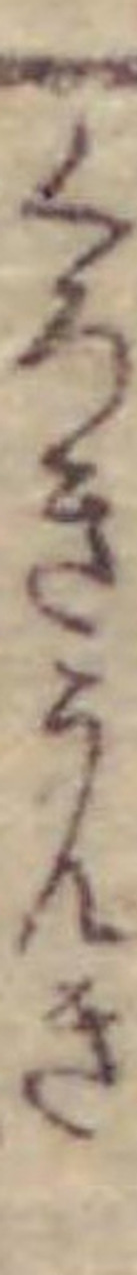くろきうんき
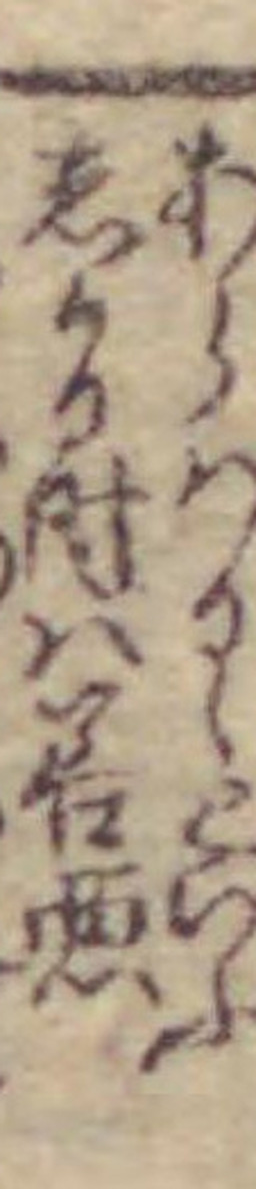しかる時は善悪
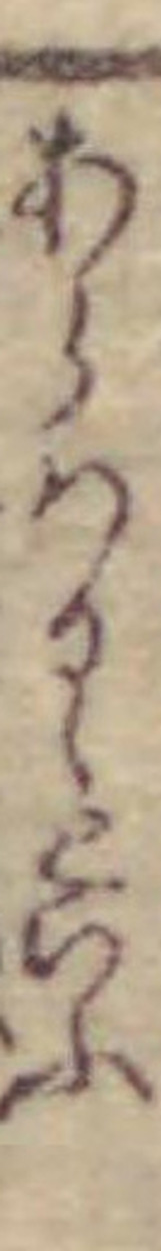あらはるゝといふ
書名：和荘兵衛後日話 : 3巻
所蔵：国立国会図書館 National Diet Library, JAPAN
